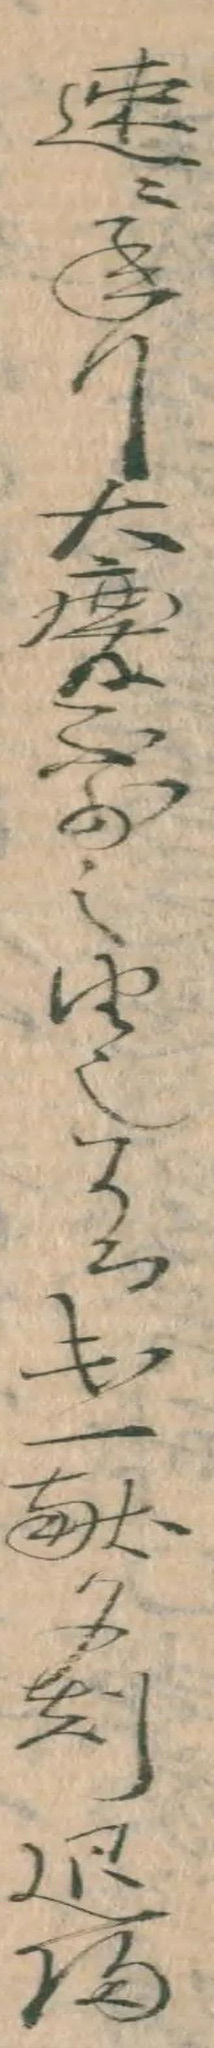速ニ承引大慶之處之由也了而出一献夕刻退帰
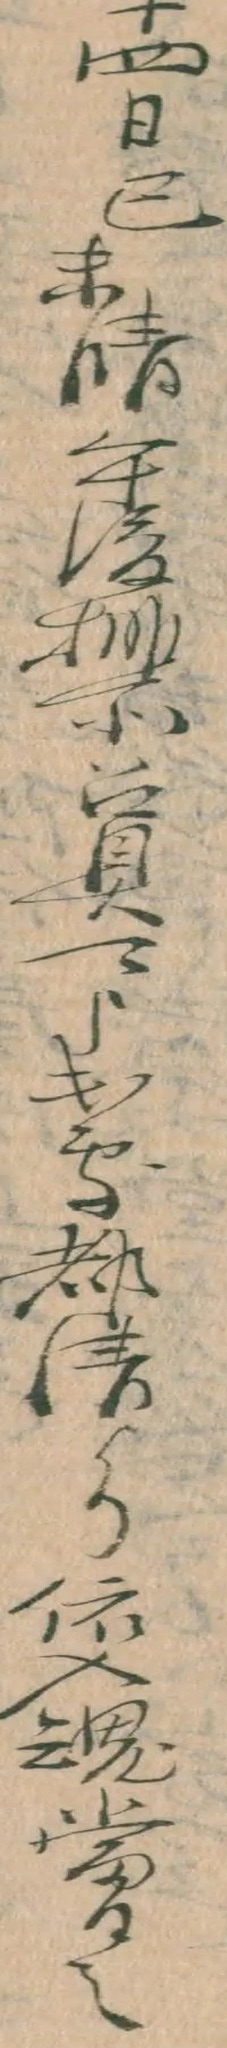十四日巳未晴午後棚所召具可申出處都清より依入魂當日之
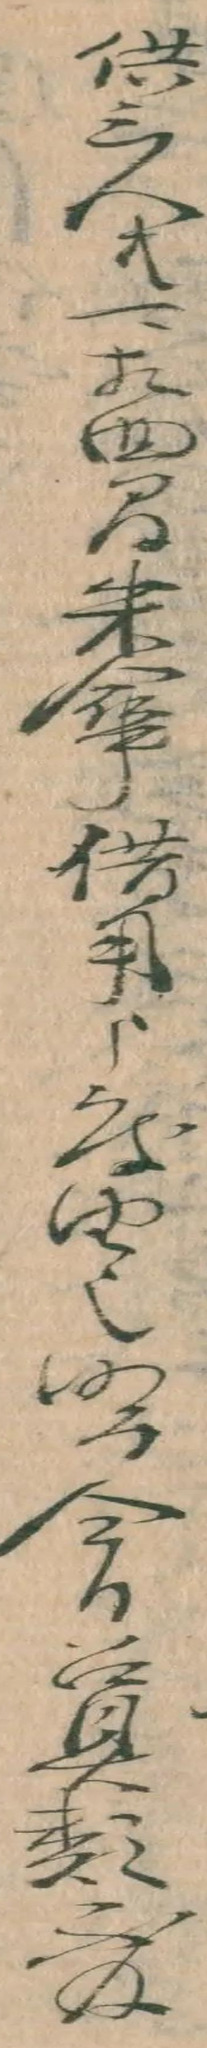供三人共可相回間朱傘借用申度由也仍而今日召具類不及
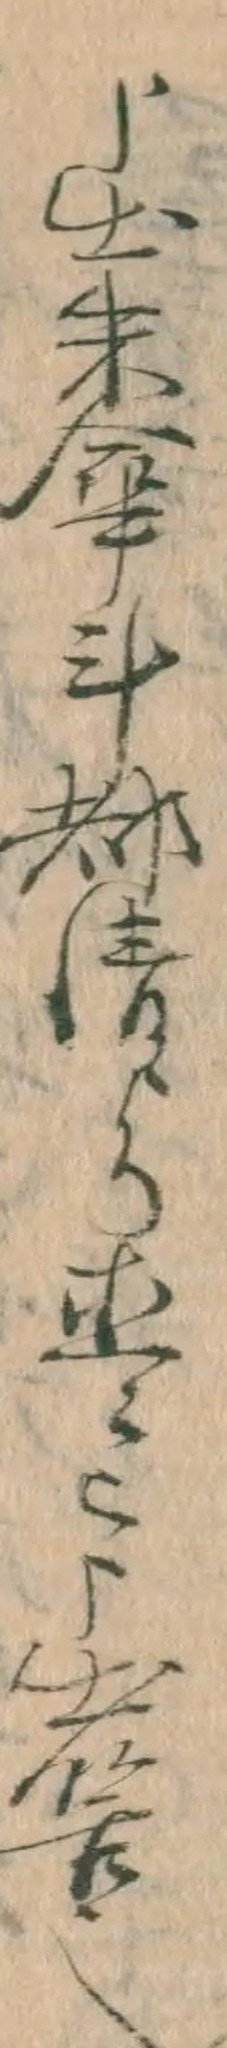申出朱傘斗都清より直々被申出筈也
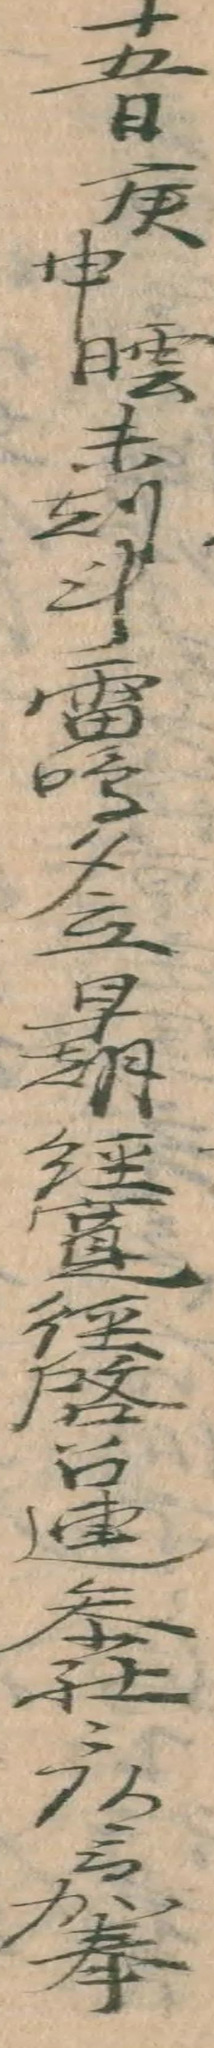十五日庚申曇未刻斗雷鳴夕立早朝経寛経啓召連参社々頭ニ而加奉
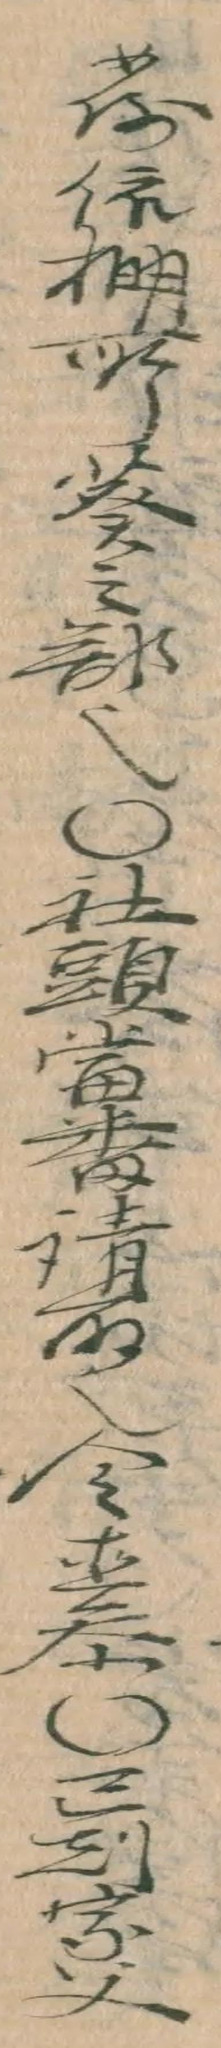如例依棚所葵之部也○社頭當番請取也令直参○巳刻家父
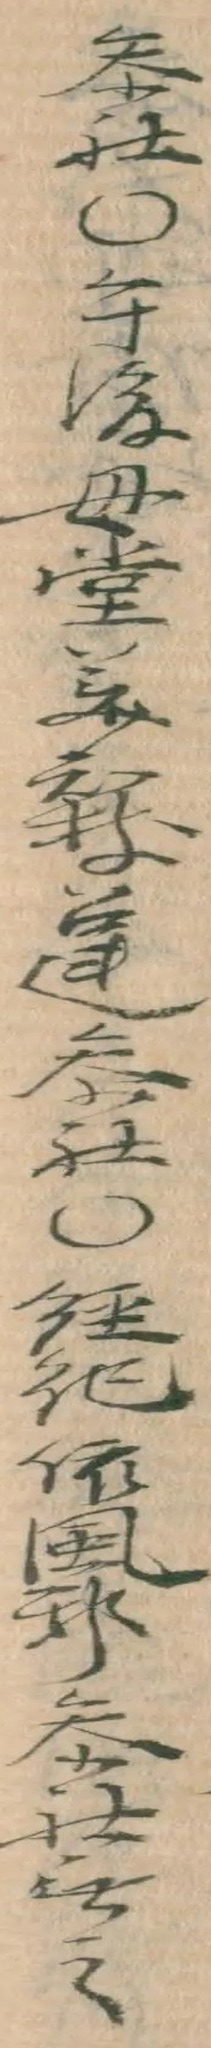参社〇午後母堂美知枝召連参社○経紀依風邪参社無之
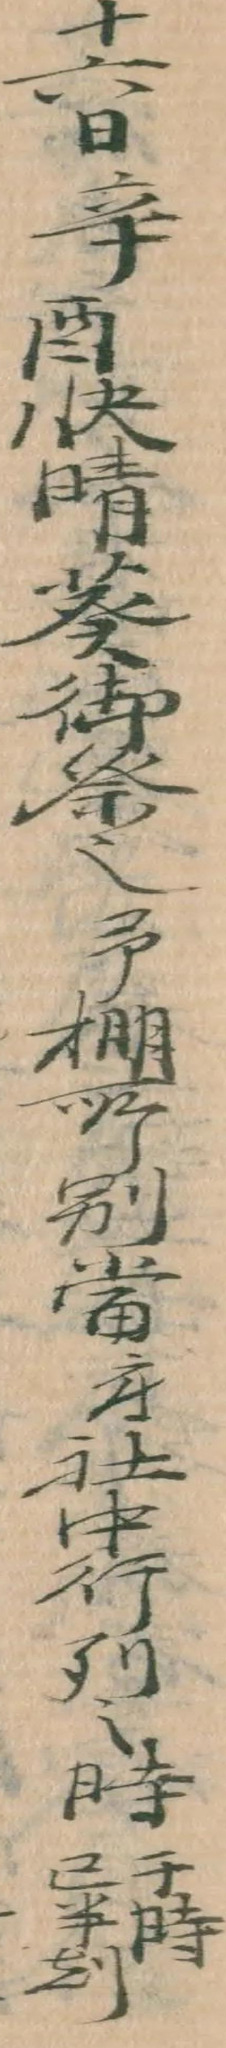十六日辛酉快晴葵御祭也予棚所別當ニ付社中行列之時于時巳半刻
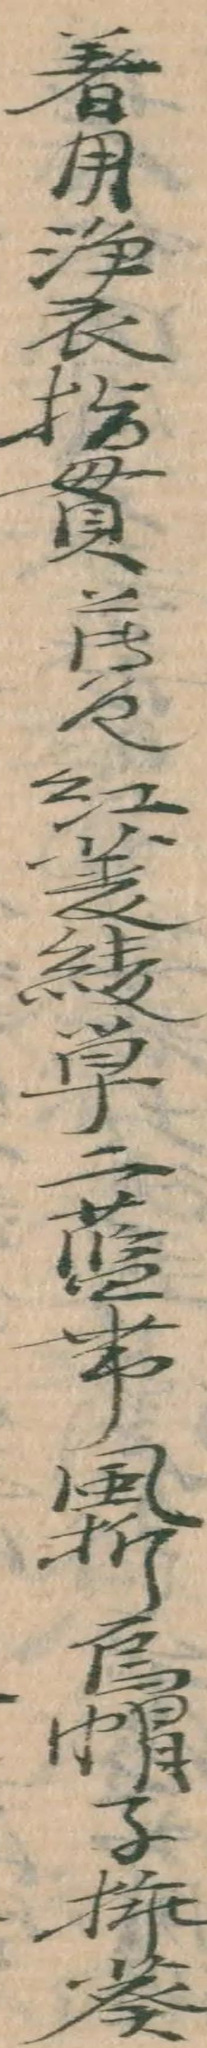着用浄衣指貫薄色紅菱綾単二藍帯風折烏帽子挿葵
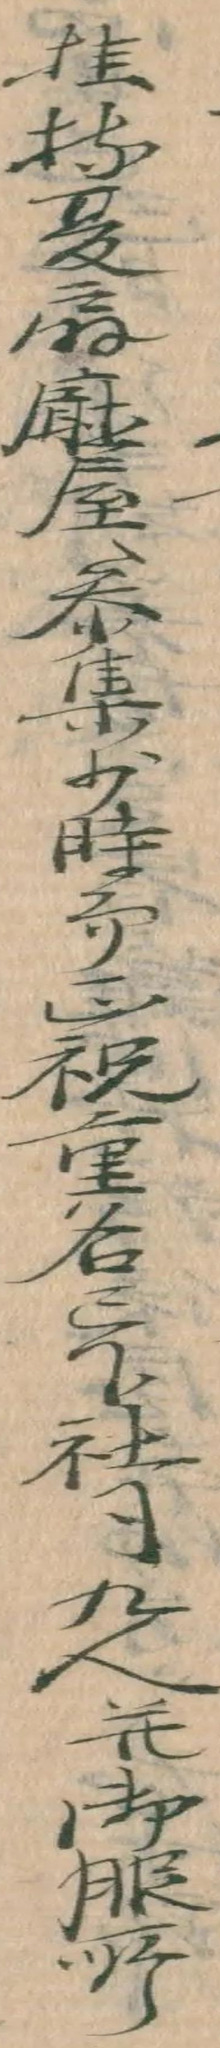桂持夏扇廳屋へ参集少時而正祝重名已下社司九人并御服所
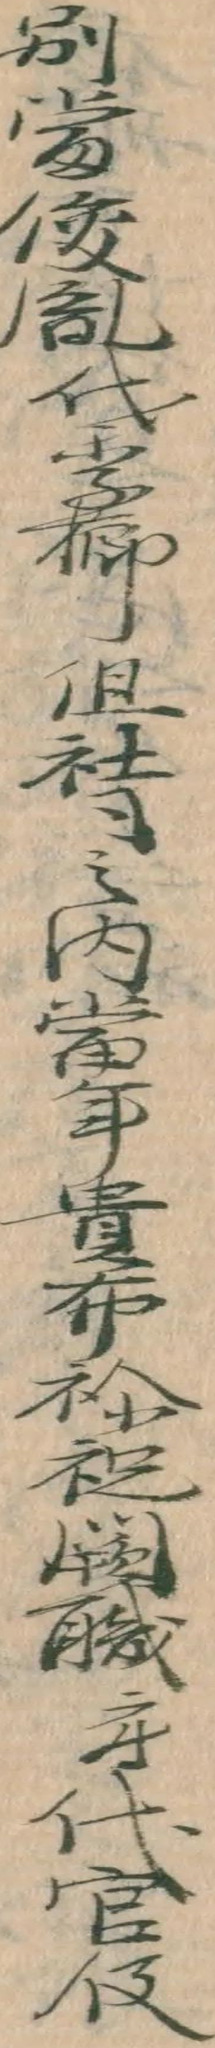別當俊胤代季櫛但社司之内當年貴布称祝闕職ニ付代官役
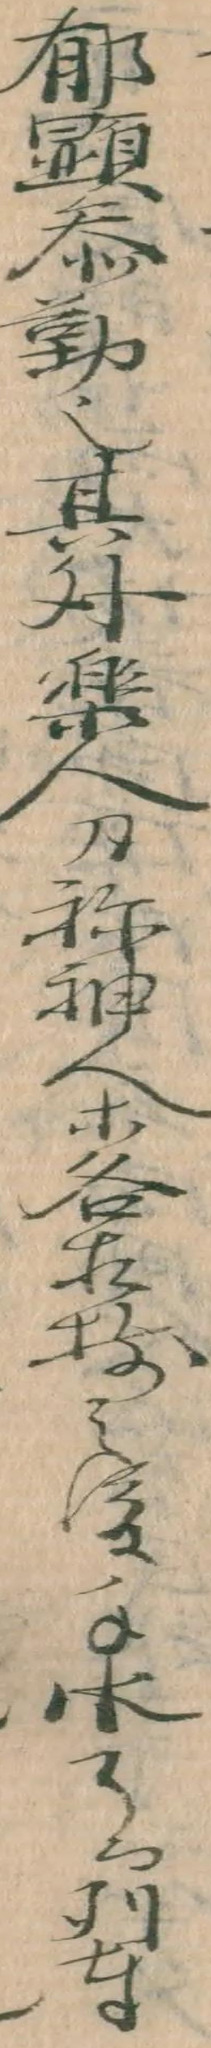郁顕参勤也其外楽人刀祢神人等各相揃之後手水了而列奉
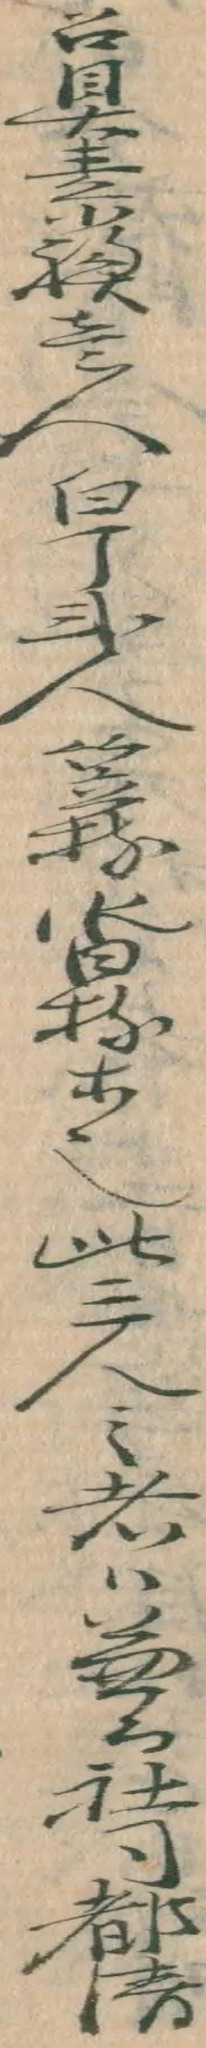召具素襖壱人白丁弐人笠持沓持等也此三人之者は兼而社司都清
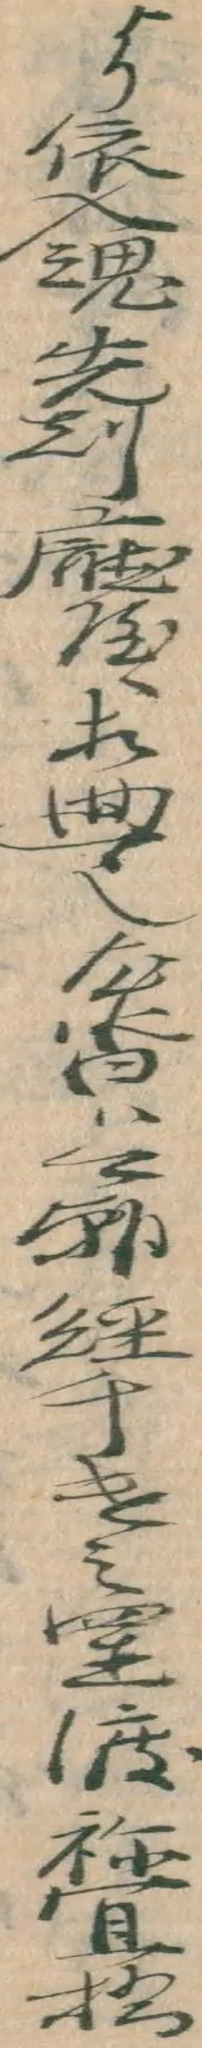より依入魂先刻廳屋へ相廻也尤沓ハ今朝経千遣之置渡祢宜橋
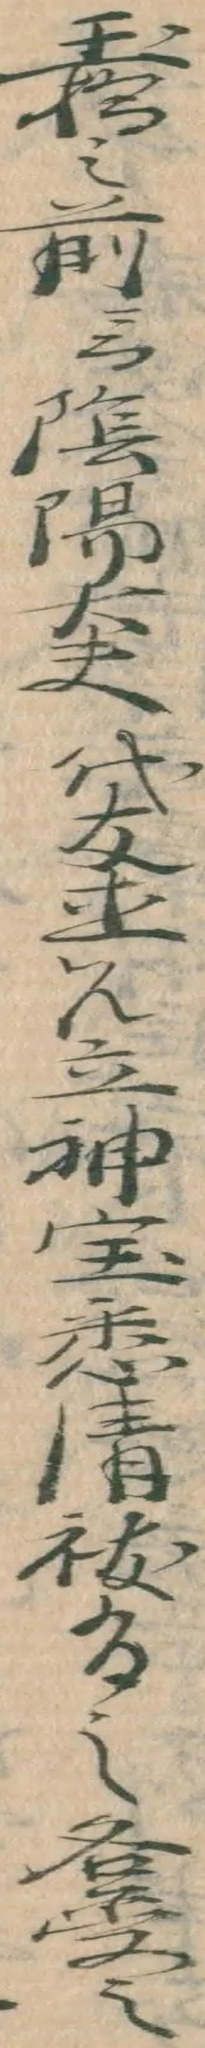玉橋之前ニ而陰陽大夫代友召立神宝悉清祓有之各受之
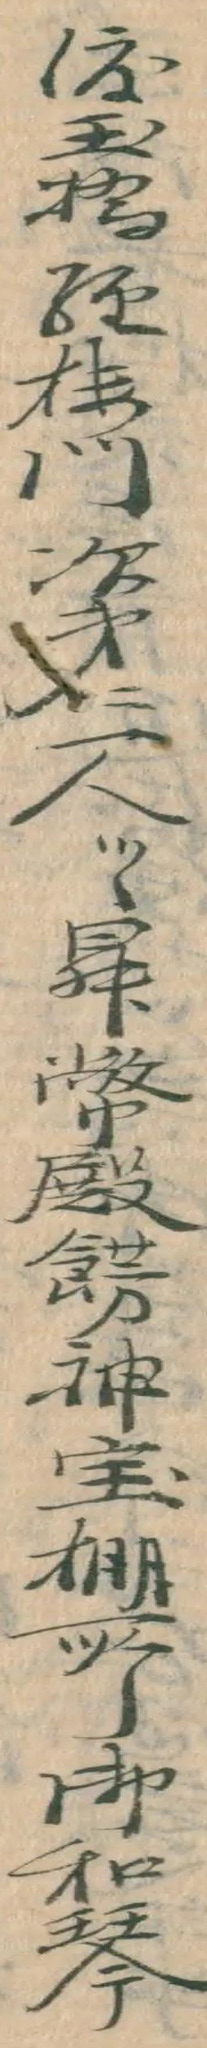渡玉橋経楼門次第ニ一人ツヽ昇幣殿餝神宝棚所御和琴
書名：賀茂社記録. 第65冊
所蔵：国立国会図書館 National Diet Library, JAPAN
